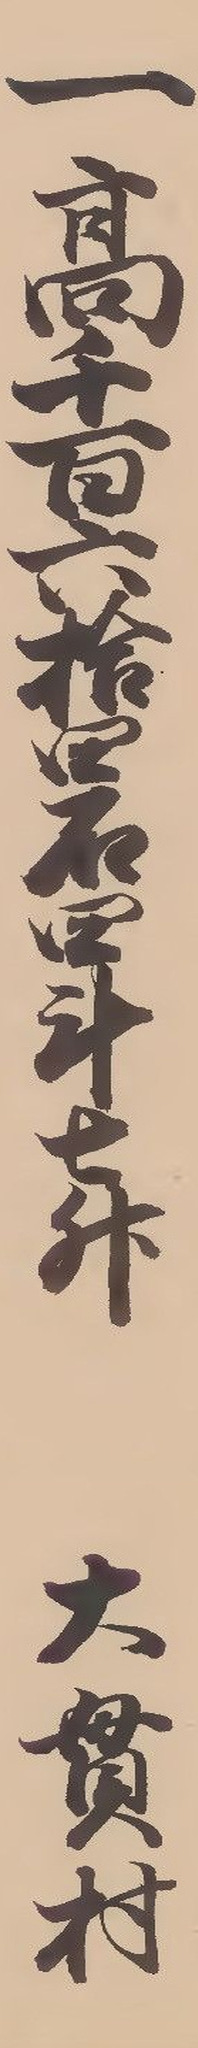一高千百六拾四石四斗七升大貫村
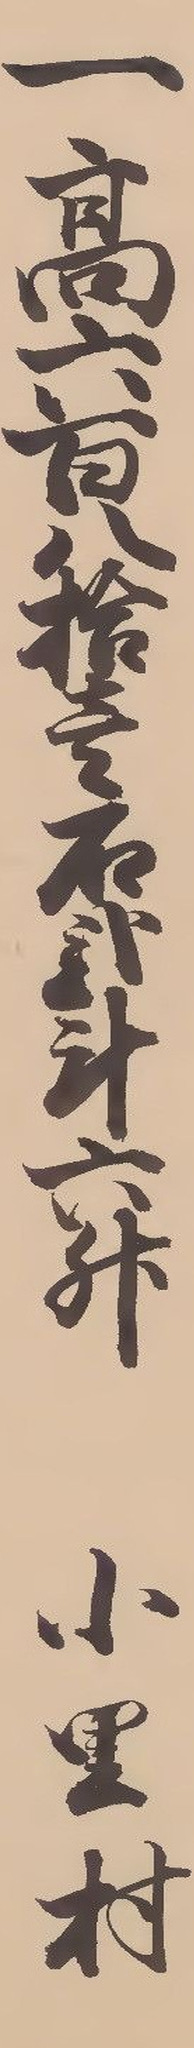一高六百八拾壱石弐斗六升小里村
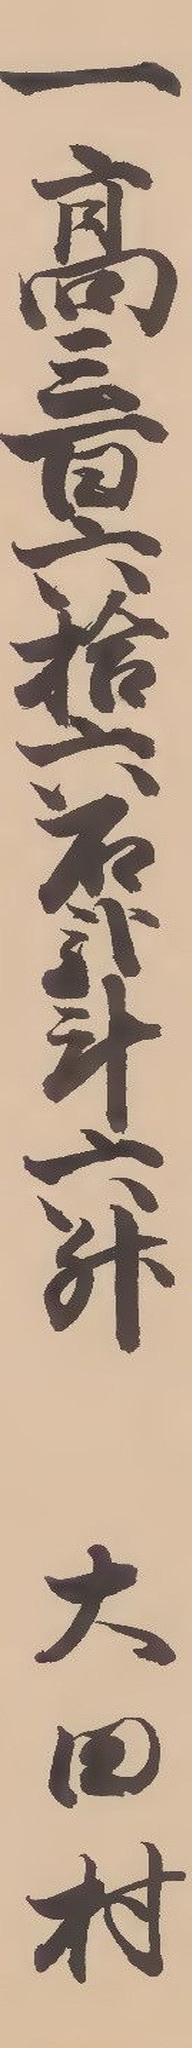一高三百六拾六石弐斗六升大田村
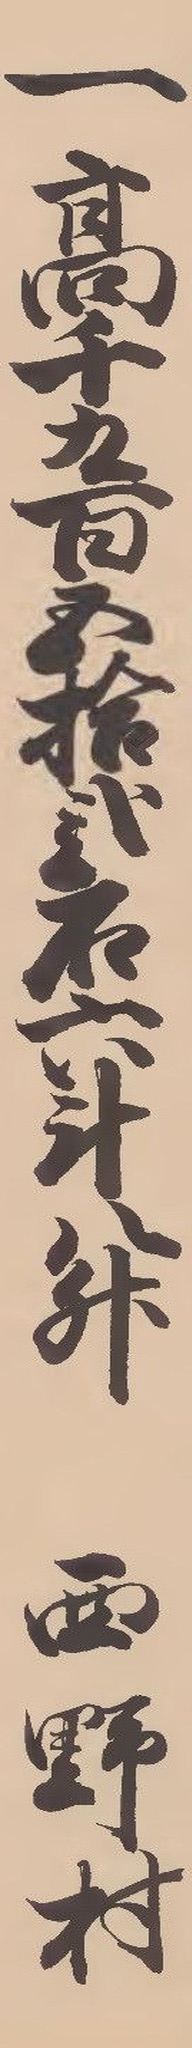一高千九百五拾弐石六斗八升西野村
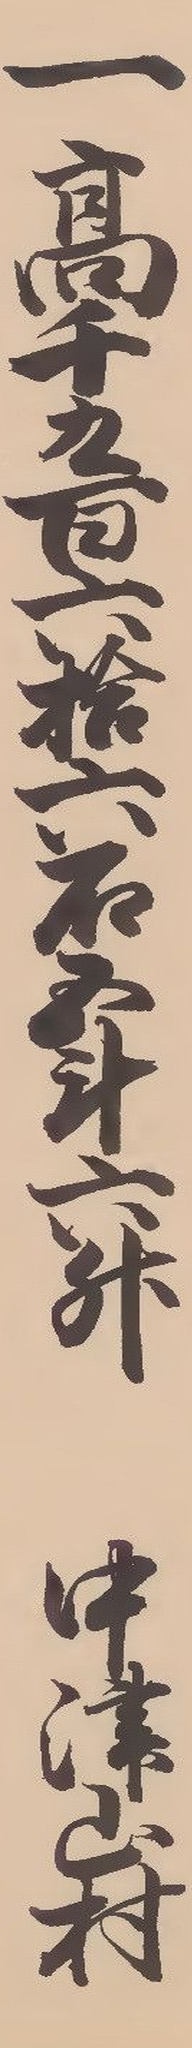一高千九百六拾六石五斗六升中津山村
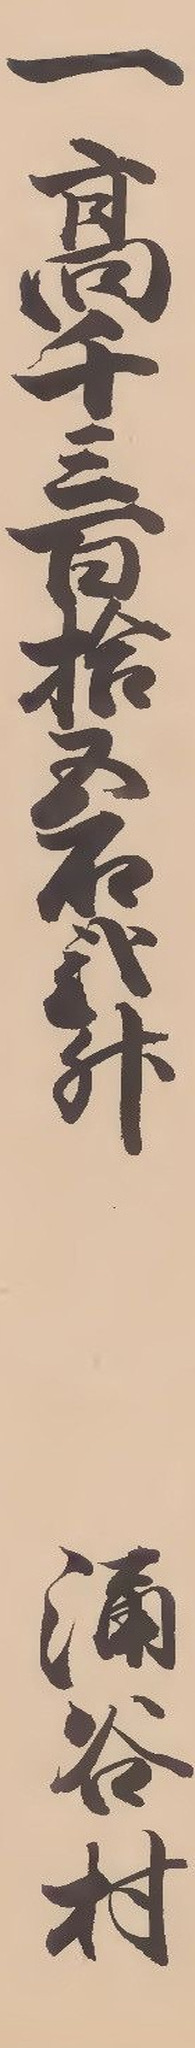一高千三百拾五石弐升涌谷村
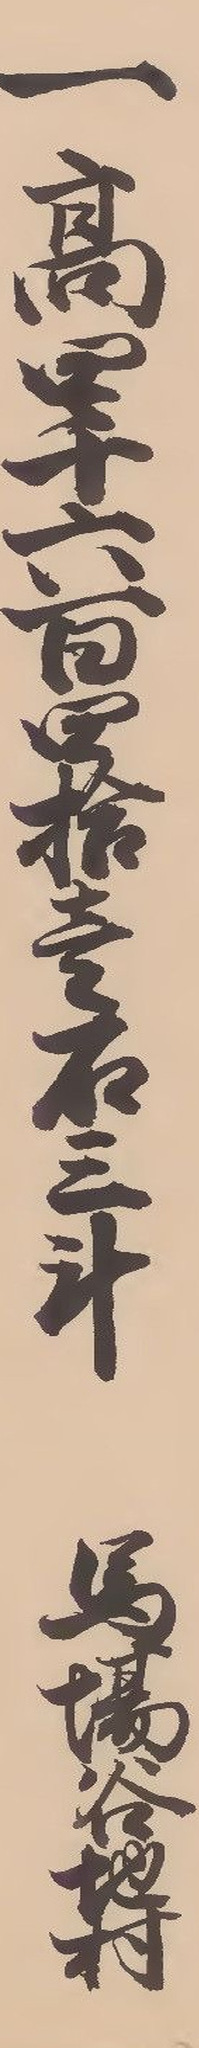一高四千六百四拾壱石三斗馬場谷地村

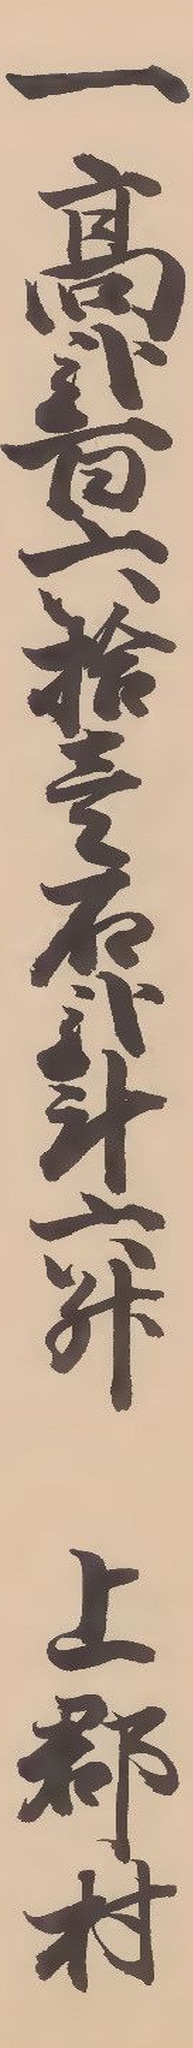一高弐百六拾壱石弐斗六升上郡村
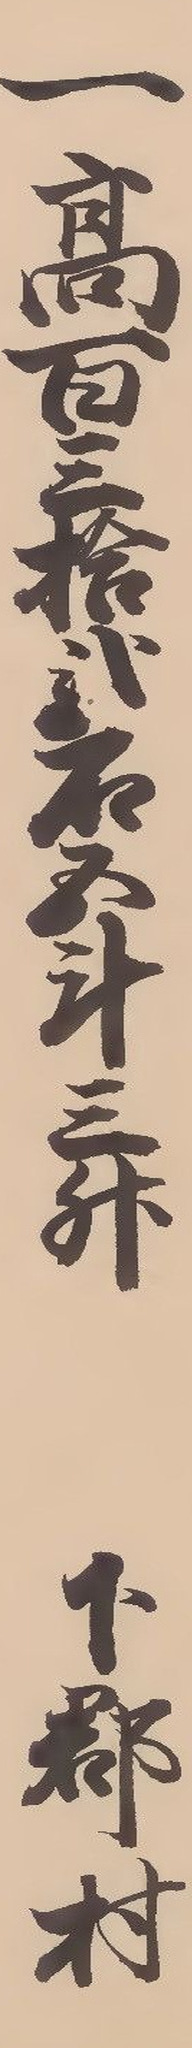一高百三拾弐石五斗三升下郡村
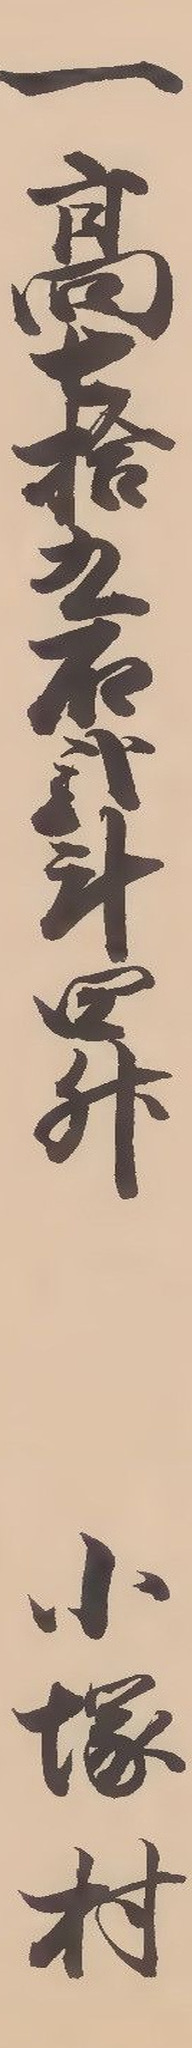一高七拾九石弐斗四升小塚村
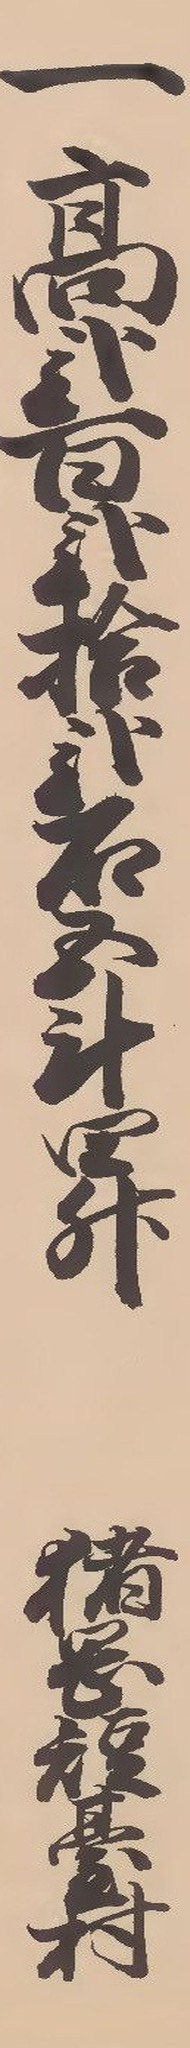一高弐百弐拾弐石五斗四升猪岡短台村
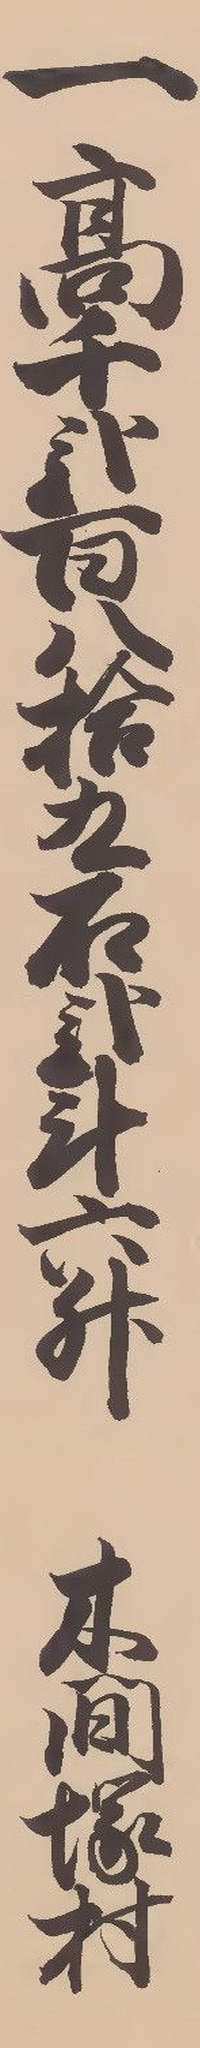一高千弐百八拾九石弐斗六升木間塚村
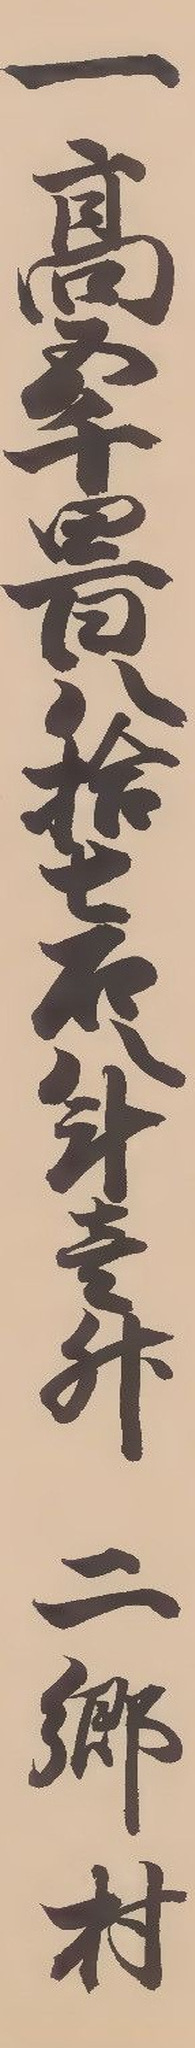一高五千四百八拾七石八斗壱升二郷村
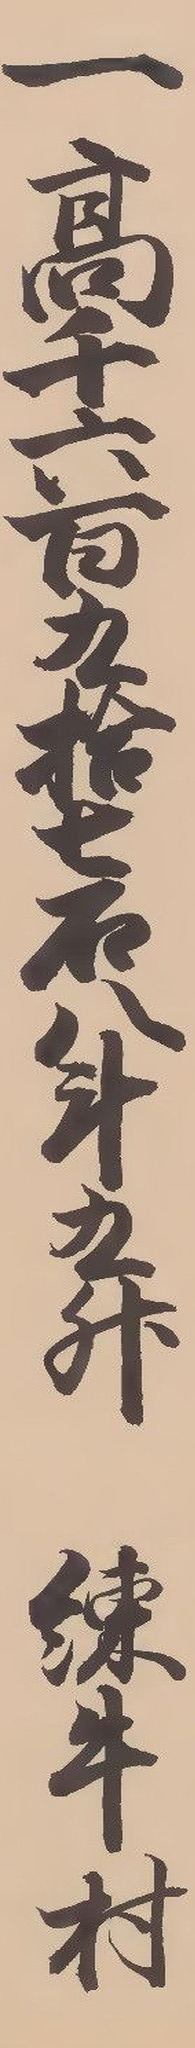一高千六百九拾七石八斗九升練牛村
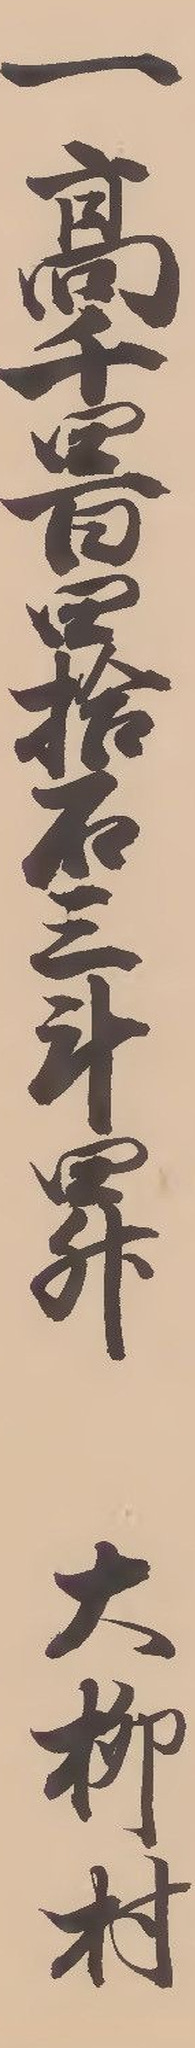一高千四百四拾石三斗四升大柳村

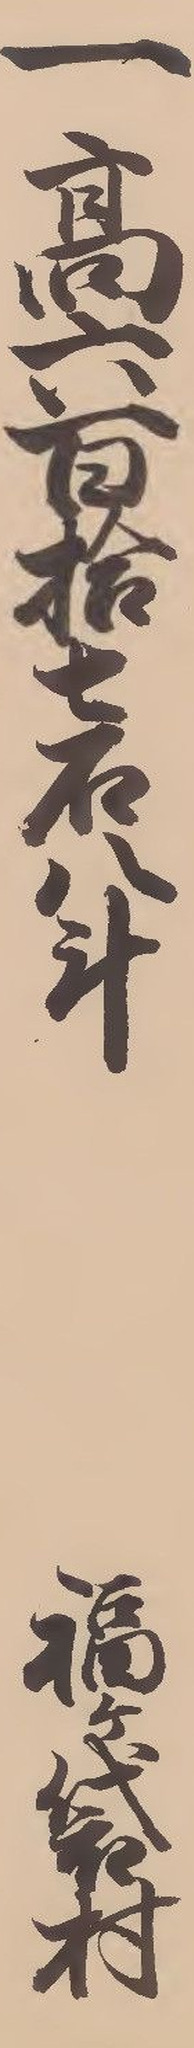一高六百拾七石八斗福ヶ袋村
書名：陸奥国郷帳　５
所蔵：国立公文書館 National Archives of Japan
